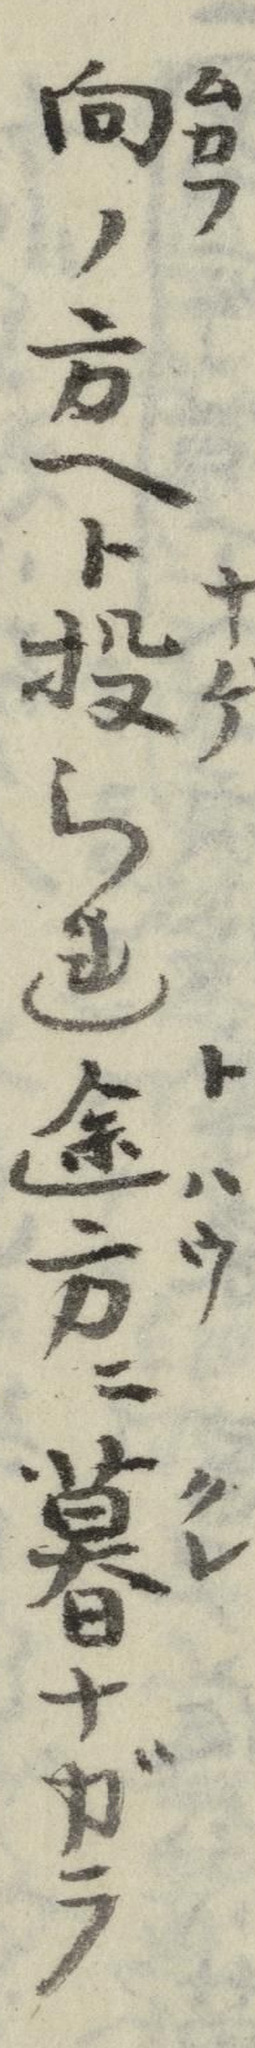向ノ方へト投られ途方二暮ナガラ
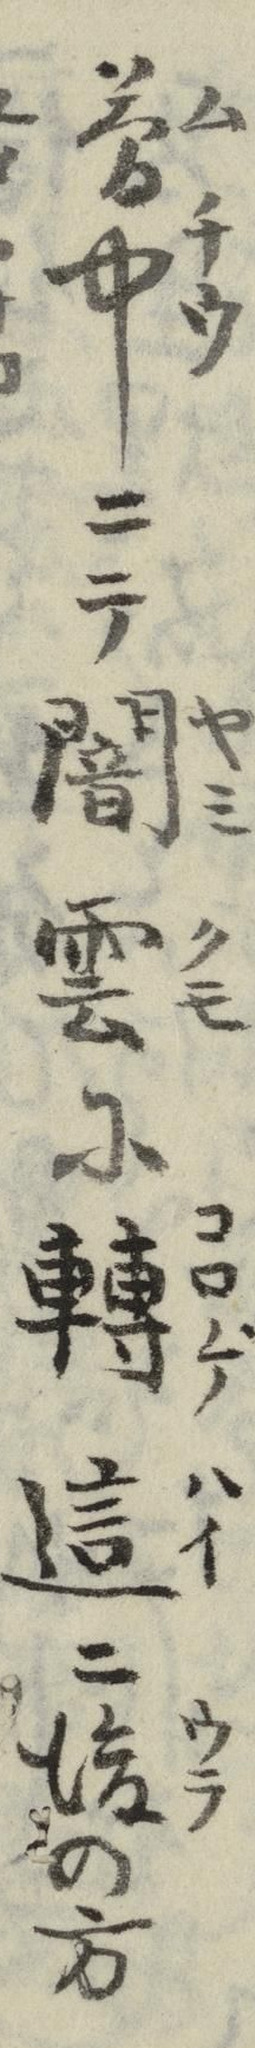夢中ニテ闇雲に転這二後の方
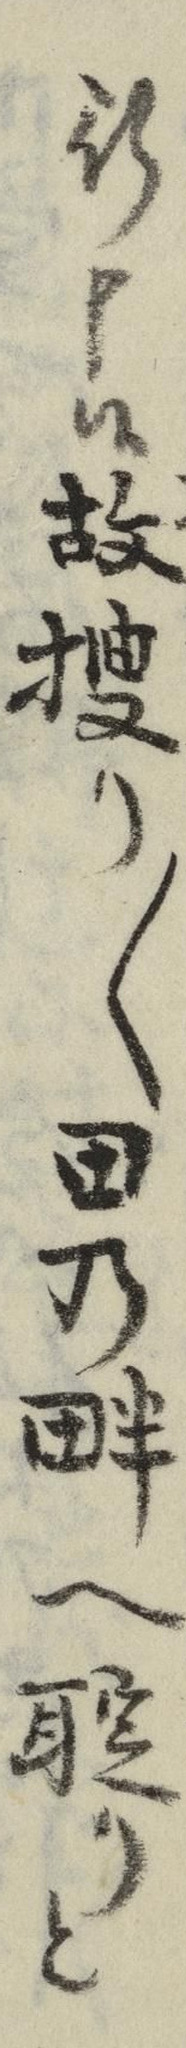行申候故搜り〳〵田乃畔へ聢りと
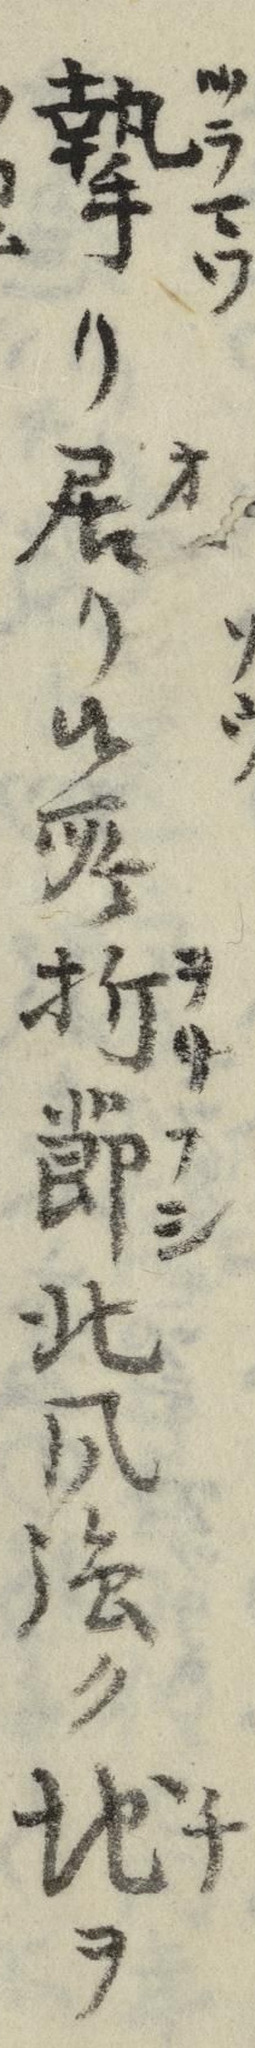摯り居り候所折節北風強ク地ヲ
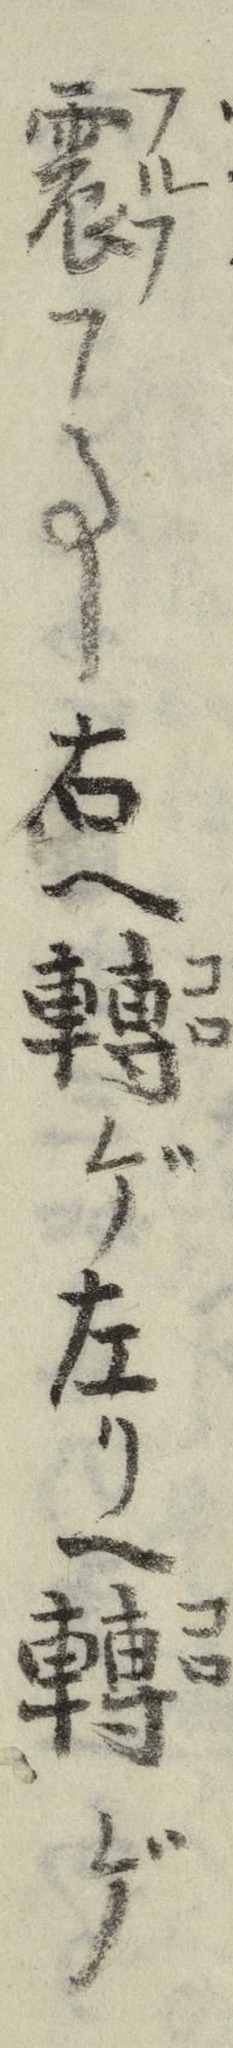震フ事右へ転ゲ左リへ転ゲ

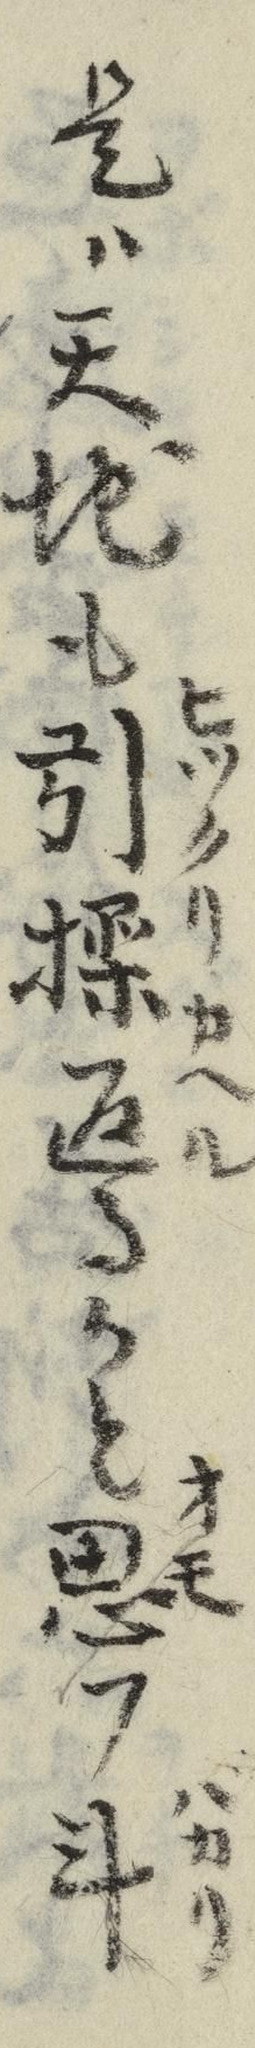是ハ天地も引繰返るかと思フ計
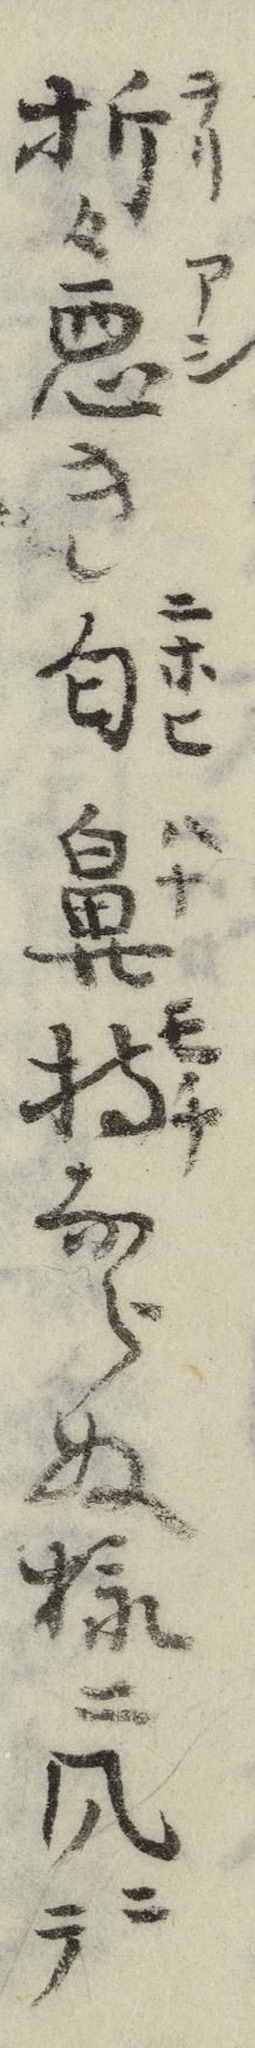折々悪き匂鼻持ならぬ様二風ニテ
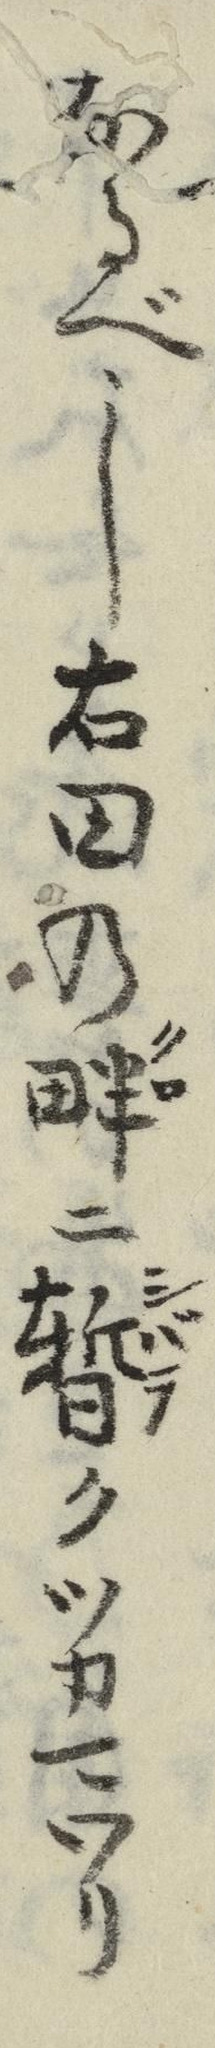なるべし右田乃畔二暫クツカマワリ
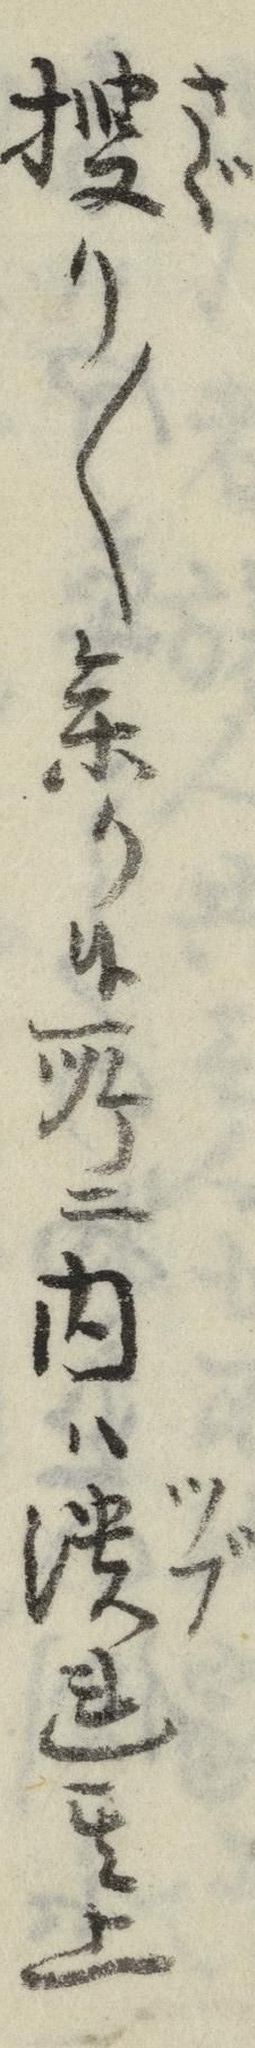搜り〳〵参り候所二内ハ潰れ其上
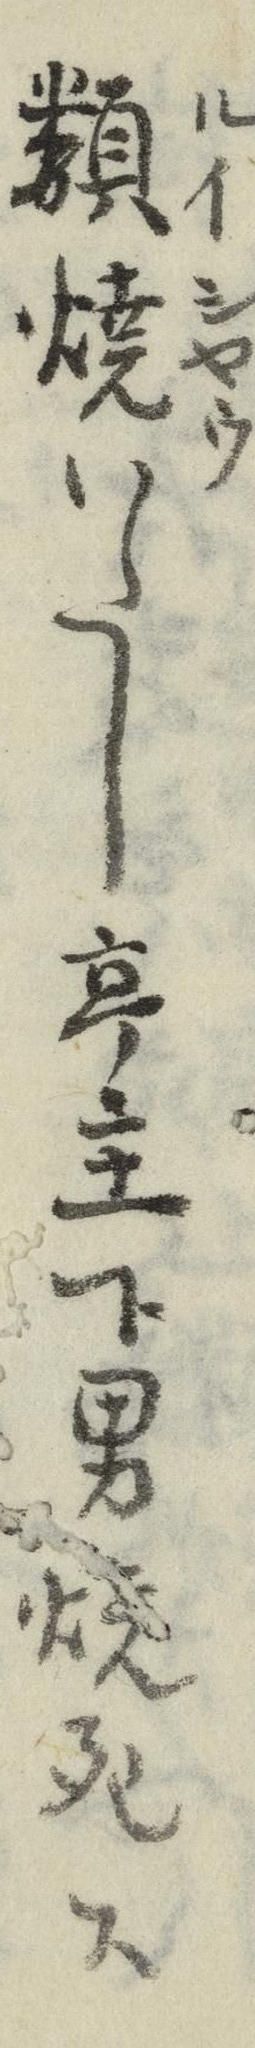類焼いたし亭主下男焼死ス
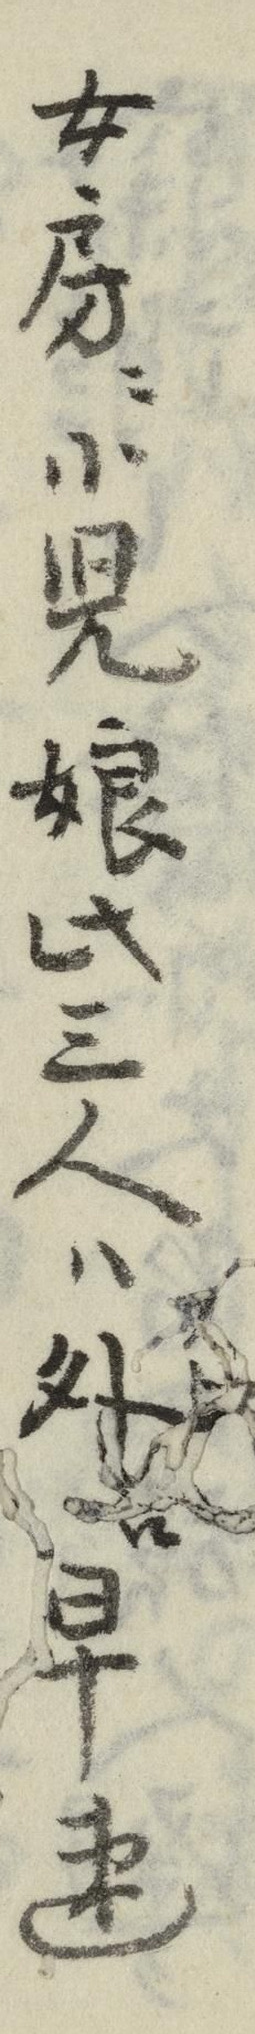女房二子児娘此三人ハ外二早速
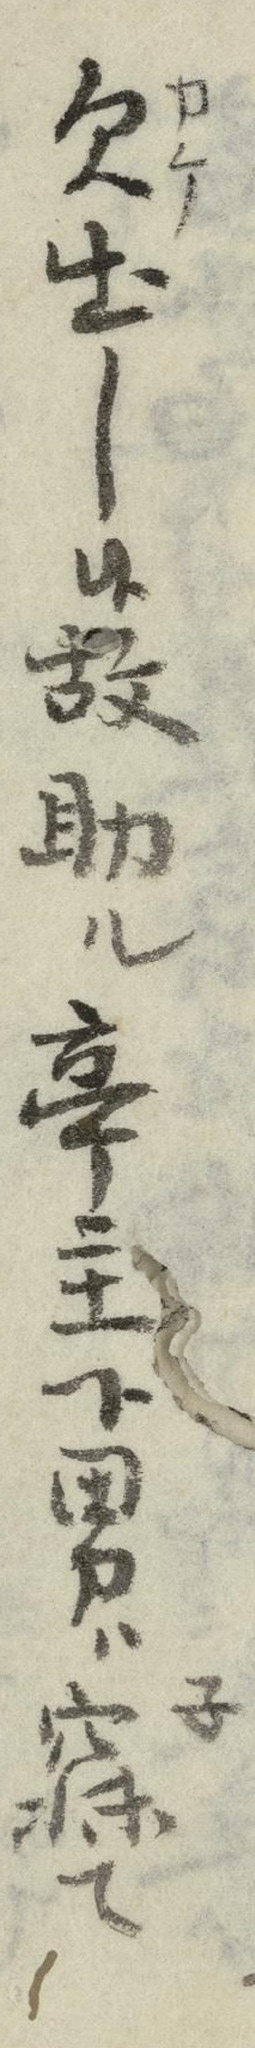欠出し候故助ㇽ亭主下男ハ寝て
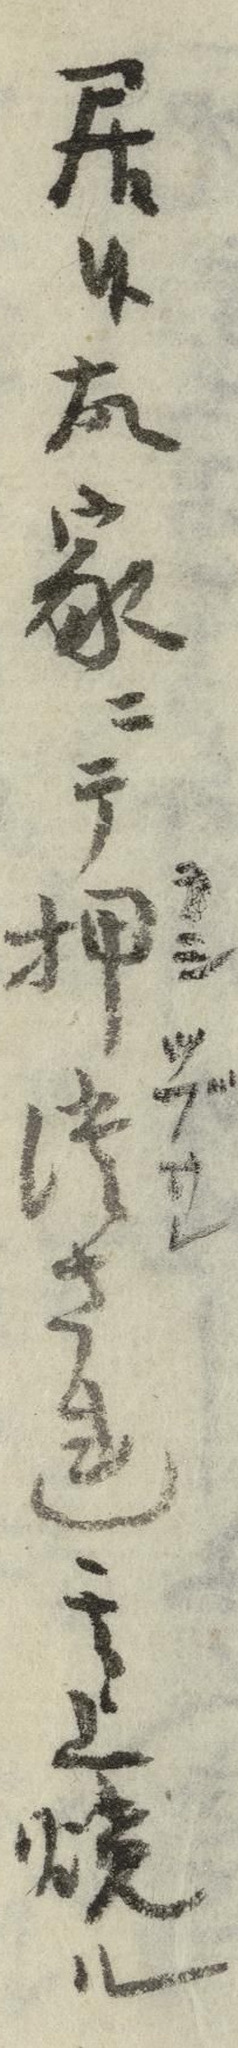居候故家ニテ押潰され其上焼ㇽ
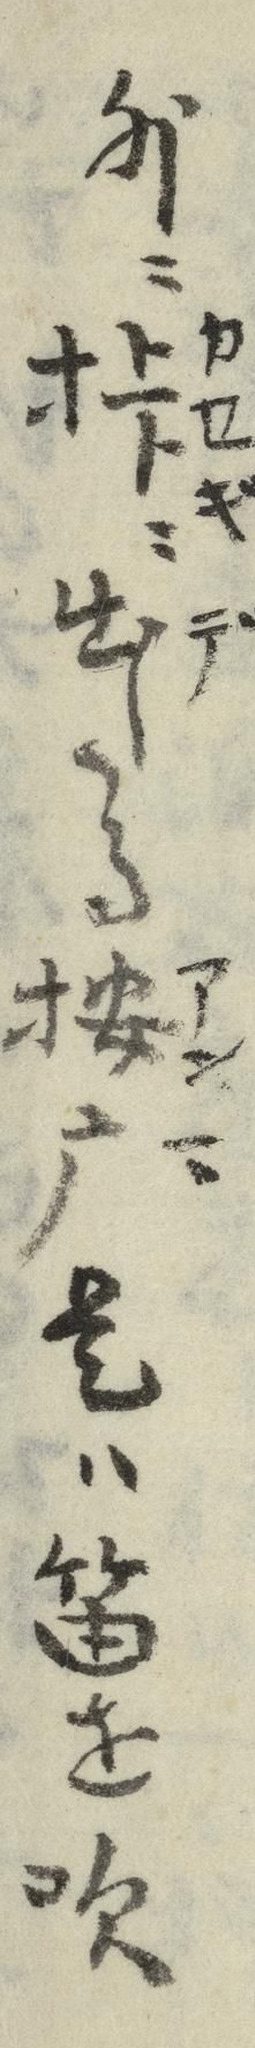外二挊二出たる按广是ハ笛を吹
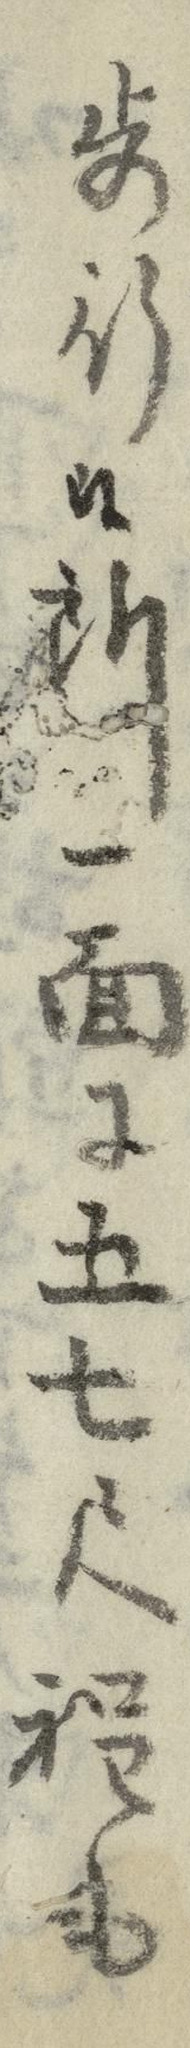歩行候所一面二五七尺程も
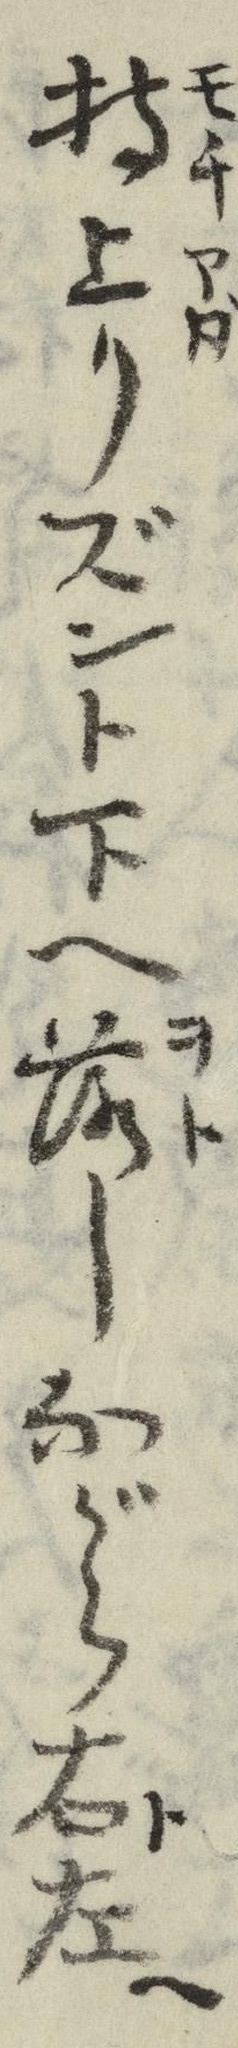持上りズント下へ落しながら右ト左へ
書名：信州大地震一件之冩　丁未弘化四年三月吉日
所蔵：東京大学地震研究所図書室 Earthquake Research Institute Library, The University of Tokyo, JAPAN
